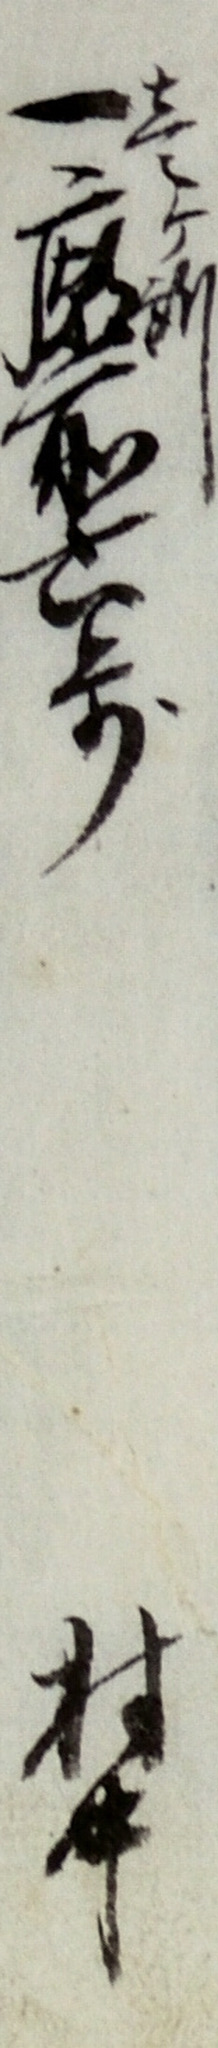一廟所六歩村中

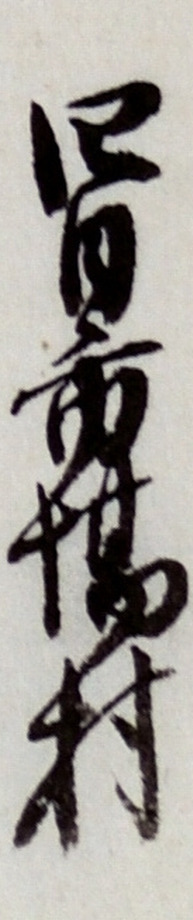四日市場村
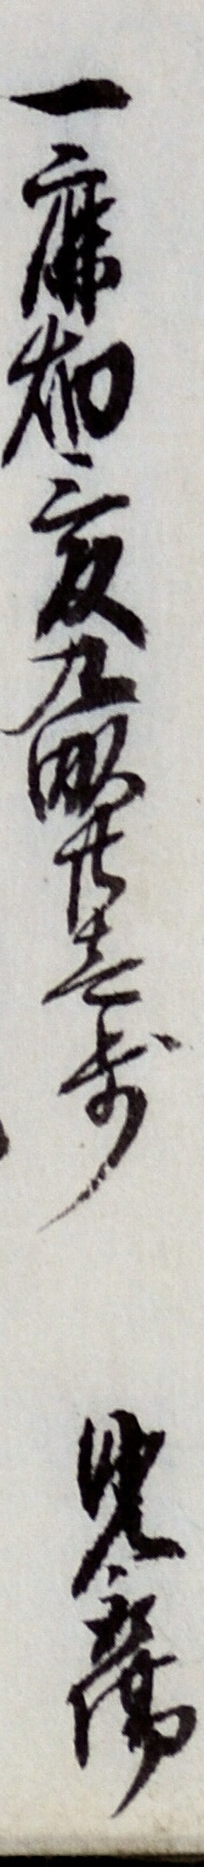一麻畑三反九畝廿壱歩見取場
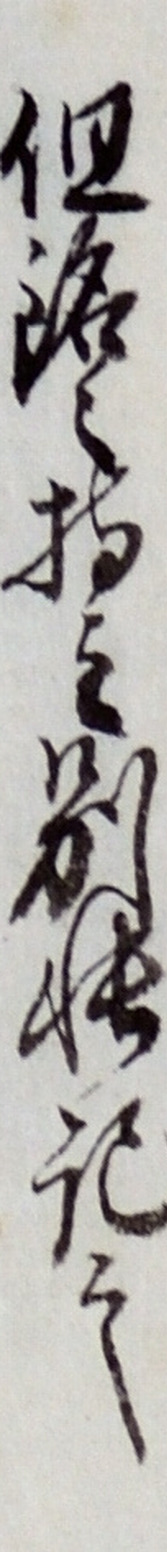但銘々持主別帳記之
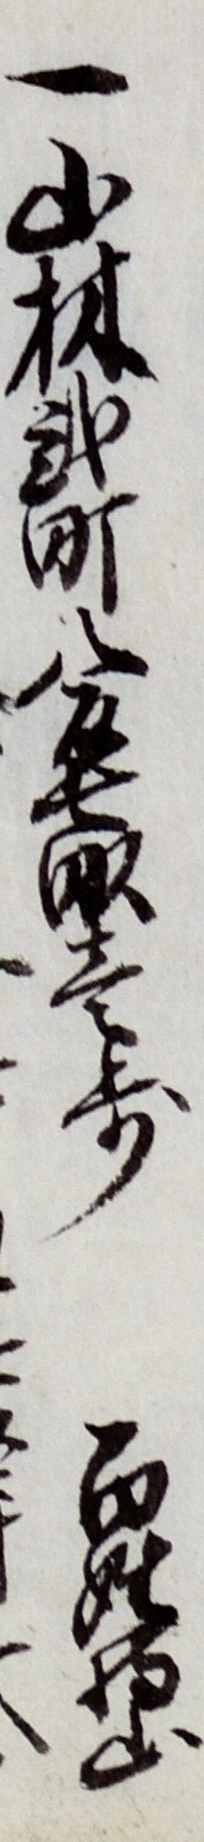一山林弐町八反七畝壱歩百姓持山
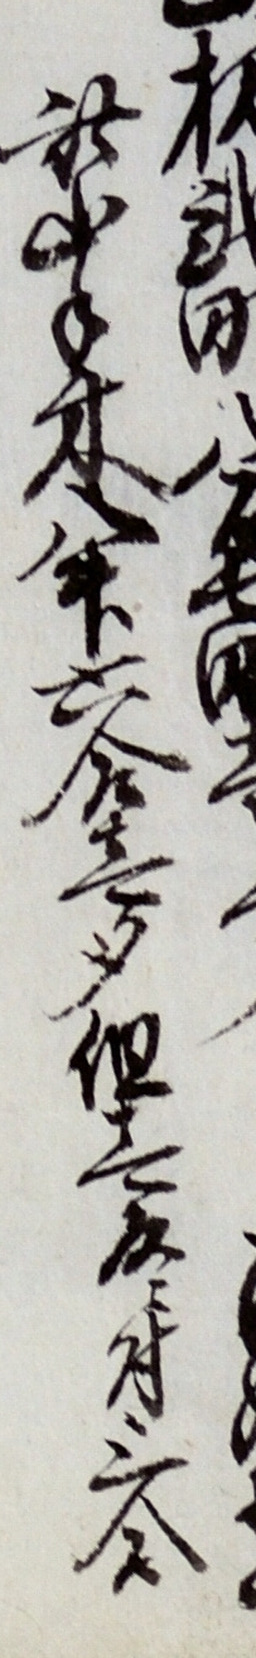此山手米八升六合壱夕但壱反ニ付三合
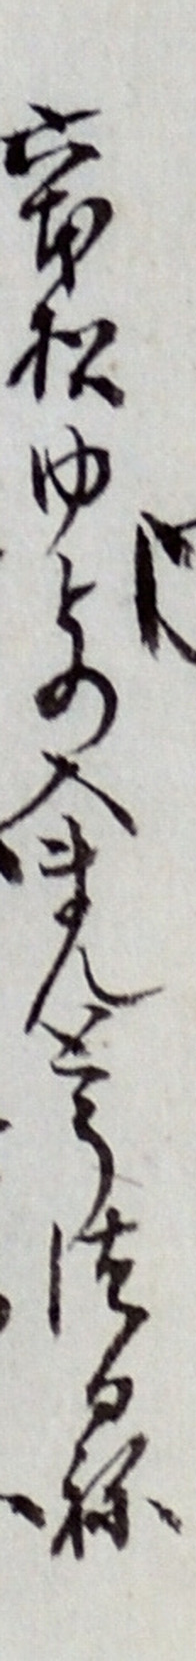六本松ゆとの入まんとうつるね
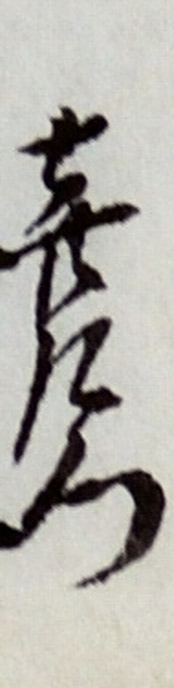喜左衛門
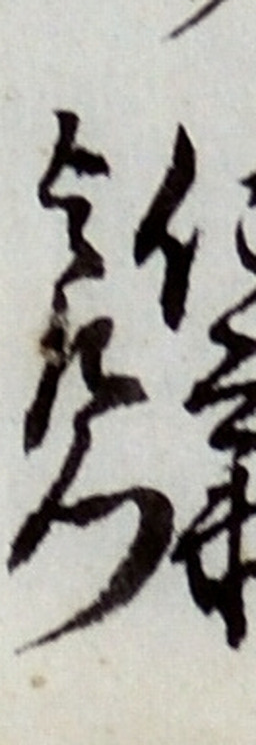与左衛門
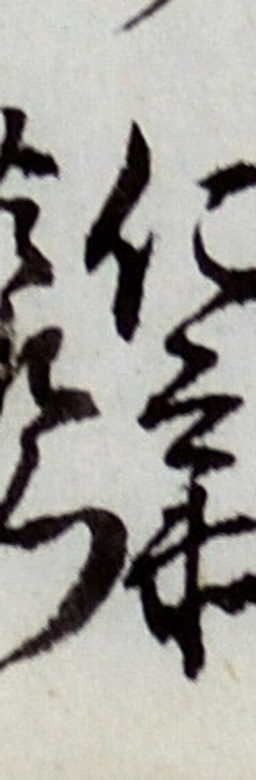与左衛門
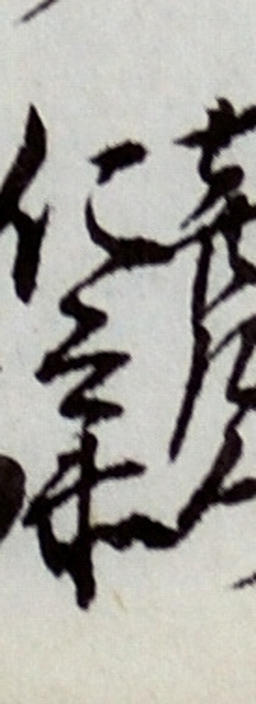仁兵衛
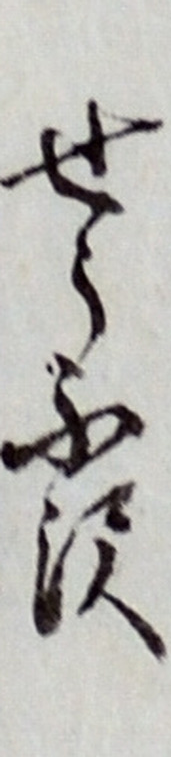せうふ沢
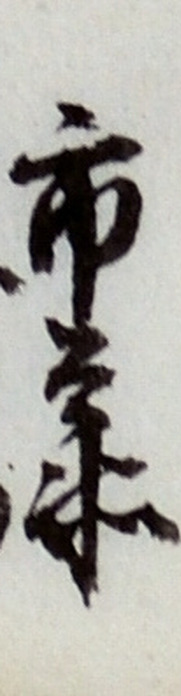仁兵衛
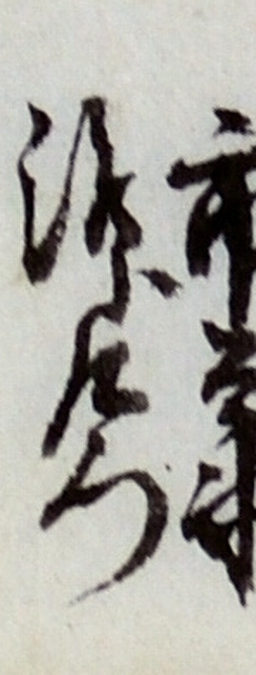清左衛門
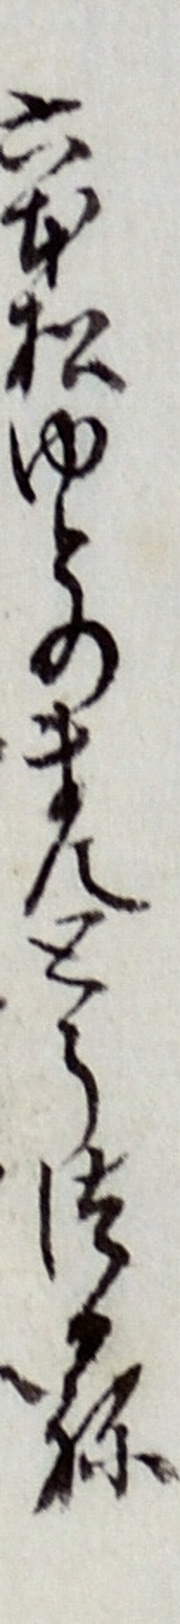六本松ゆとのまんとうつるね
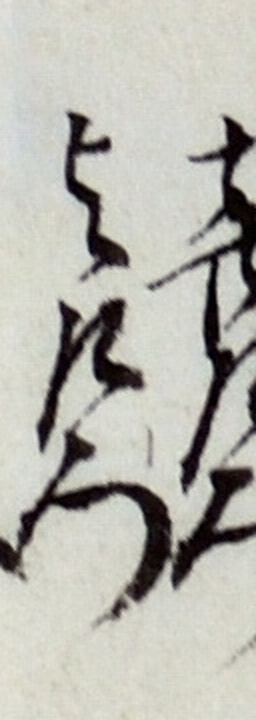与左衛門
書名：御領分中山林社地手控
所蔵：伊那市立高遠町図書館・合同会社AMANE
